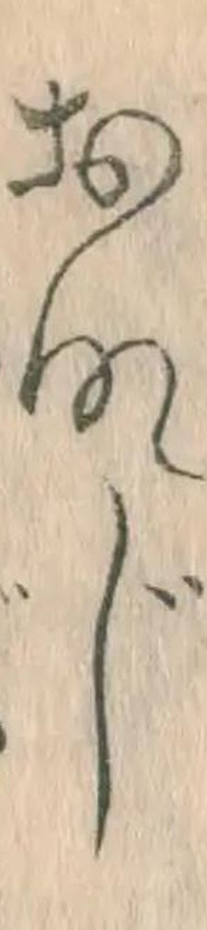おなじ
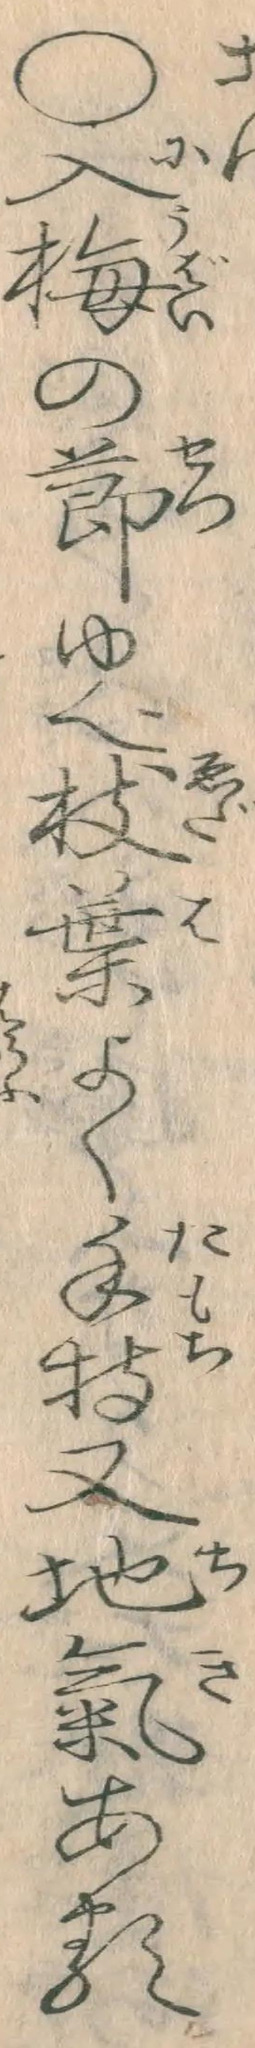○入梅の節ゆへ枝葉よく手持又地気ある
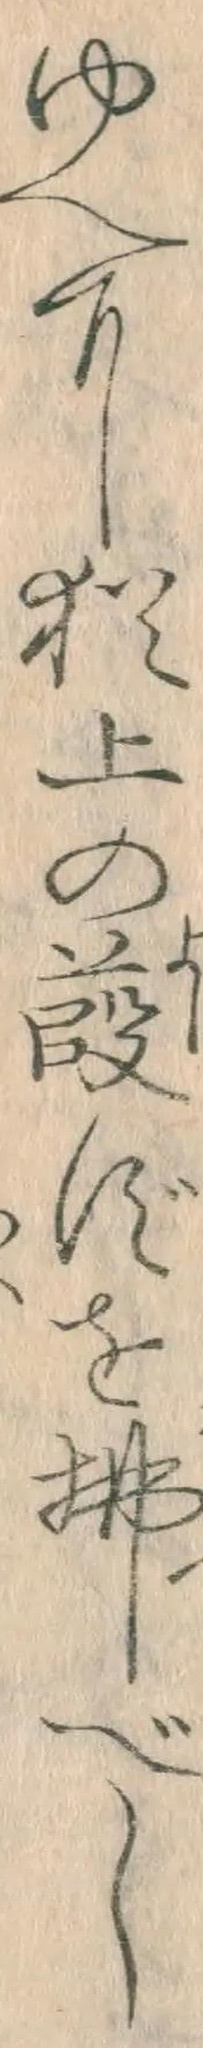ゆへに猶上の葭ずを払べし
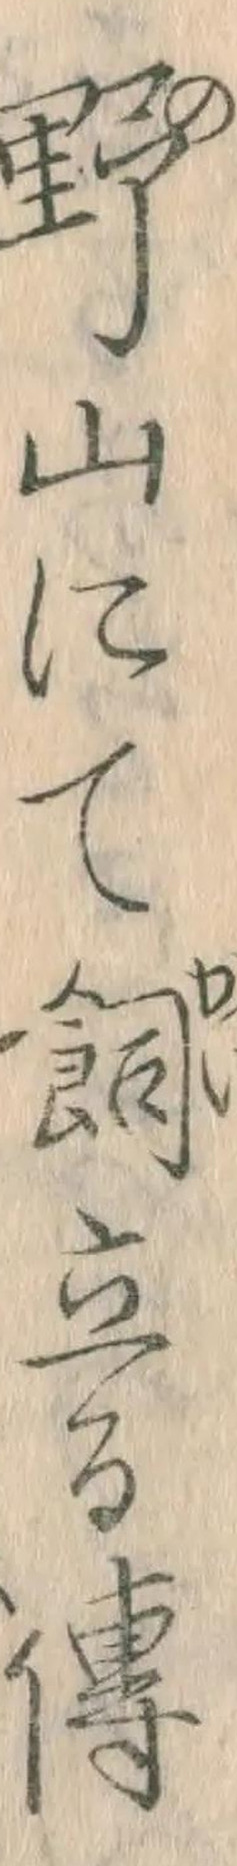野山にて飼立る傳
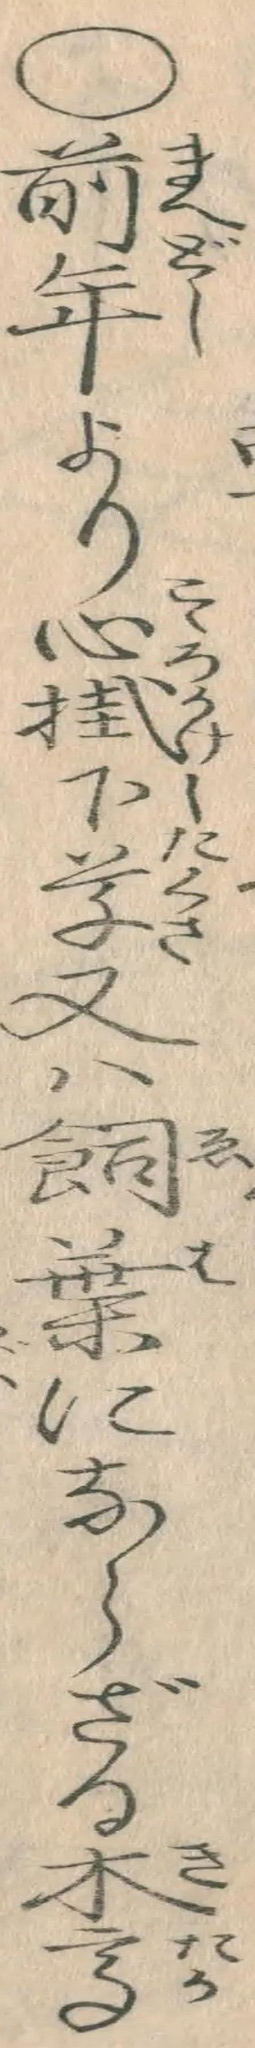○前年より心掛下草又は飼葉にならざる木高
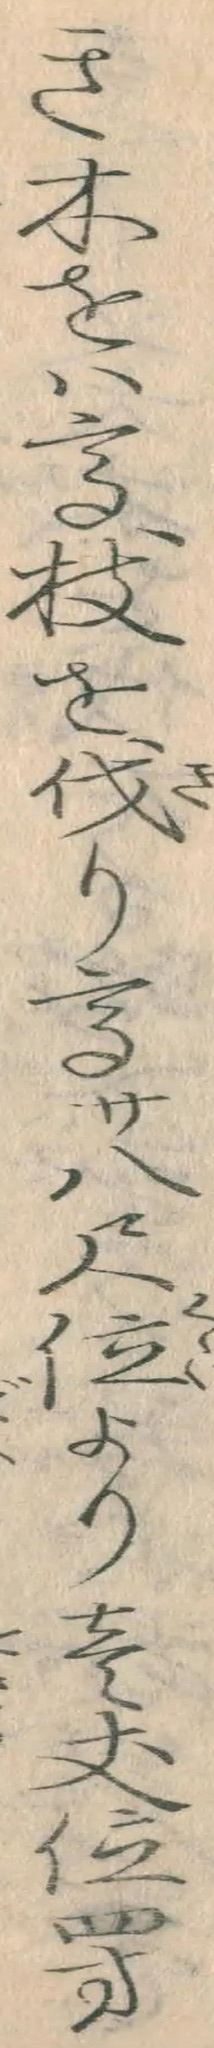き木をは高枝を伐り高さ八尺位より壱丈位四寸
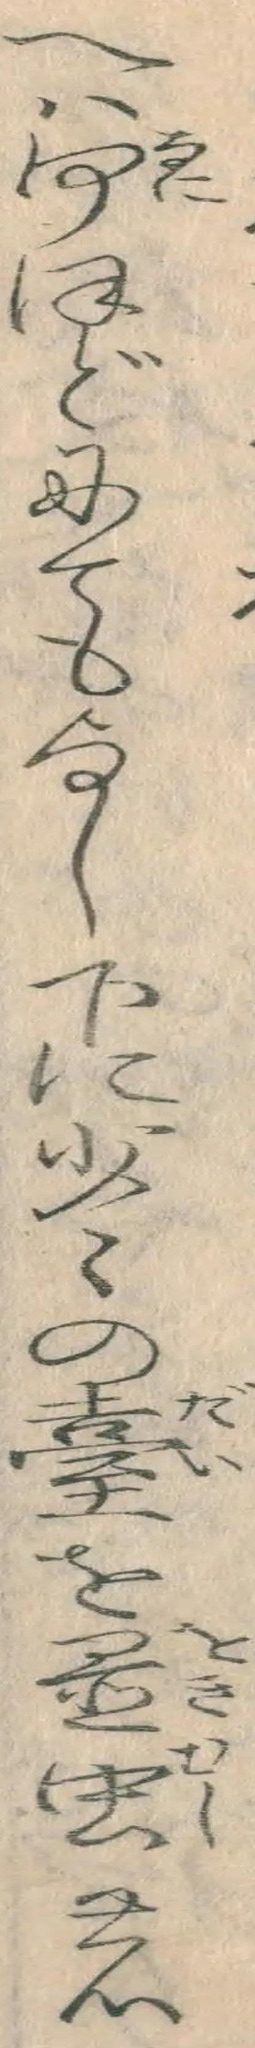へは何ほどにてもよし下に少々の台を置虫の

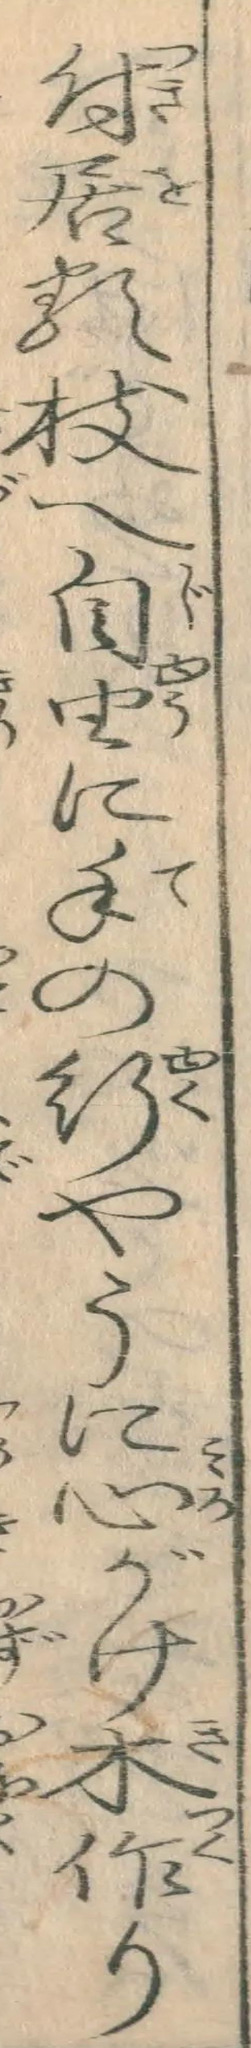付居る枝へ自由に手の行やうにこゝろがけ木作り
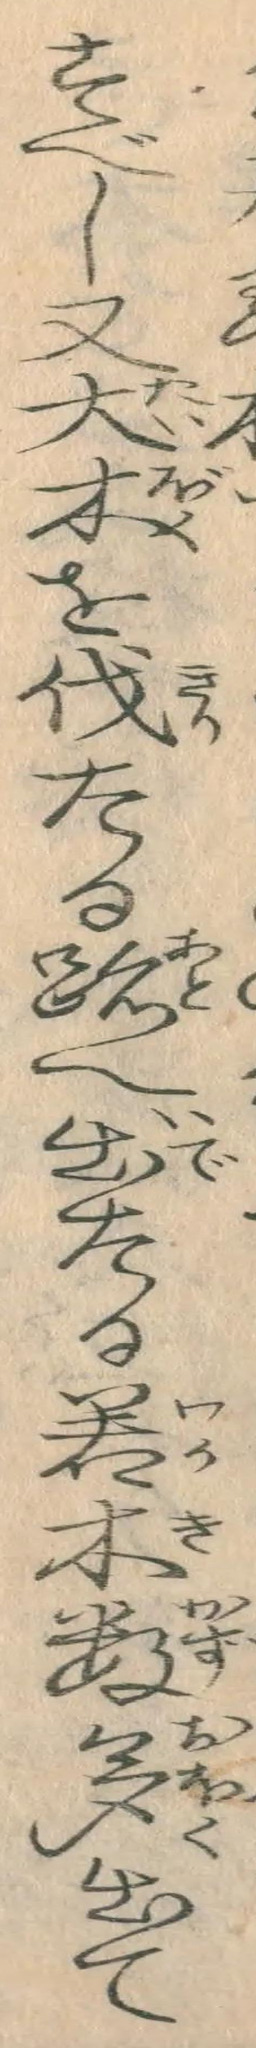すべし又大木を伐たる跡へ出たる若木数多く出て
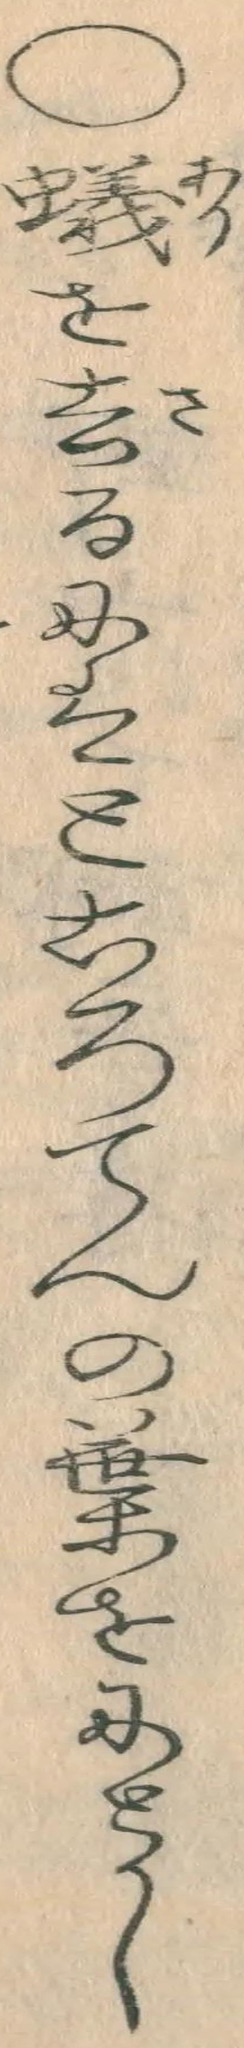○蟻を去るにはところてんの葉をにとかし
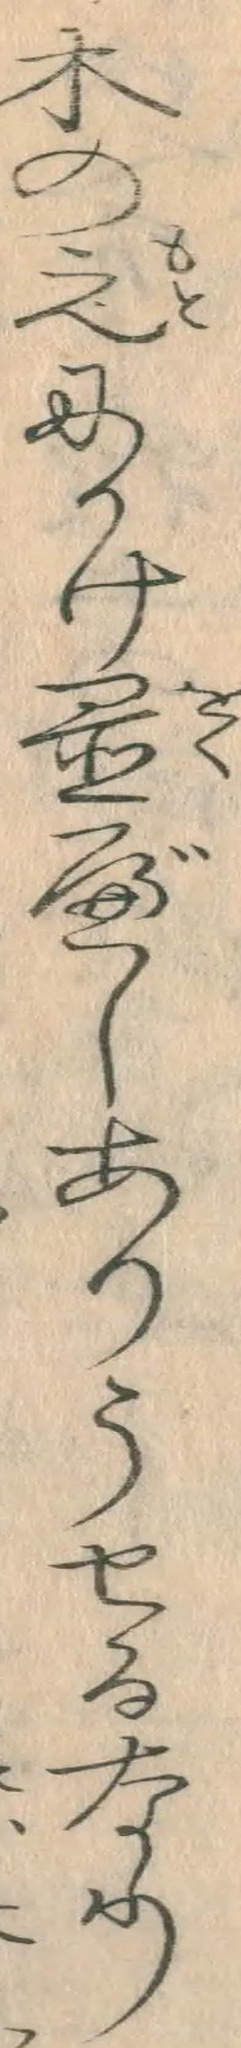木の元にかけ置べしありうせるなり
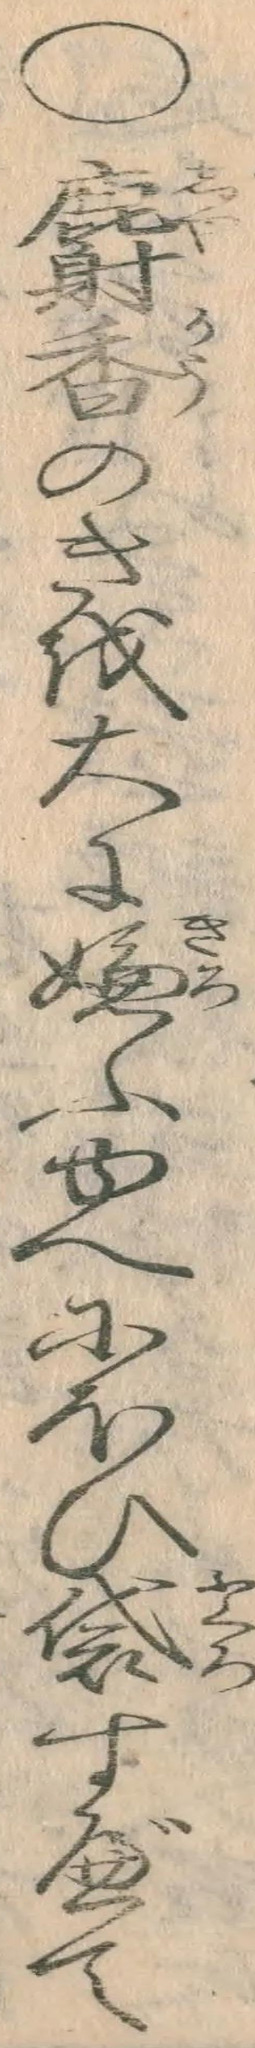○麝香のきを大に嫌ふゆへにほひ袋すべて
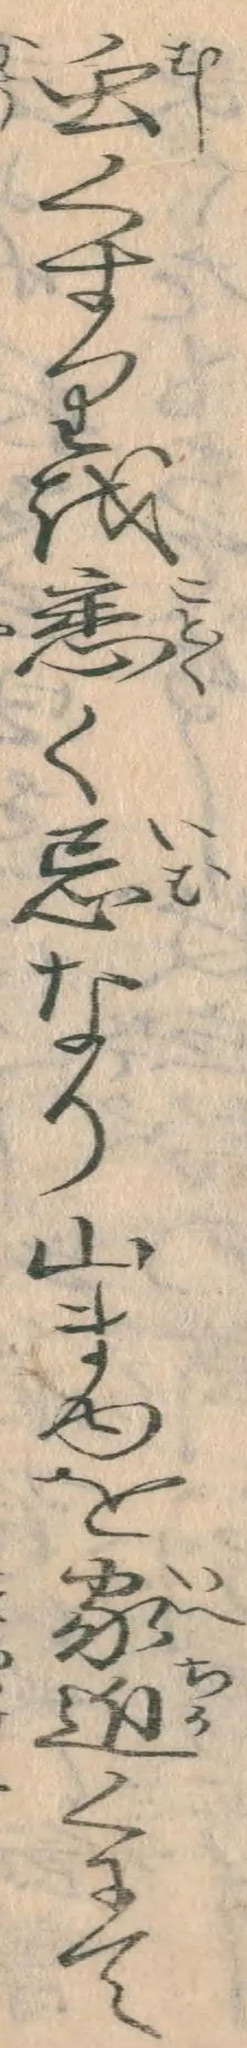虫くすりを悉く忌なり山まゆを家近くにて
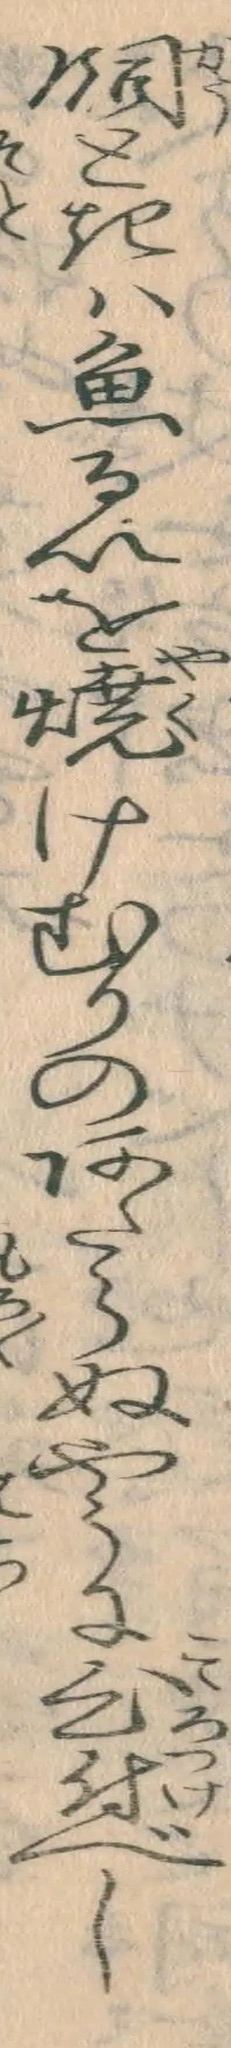飼ときは魚るいを焼けむりのあたらぬやうに心付べし
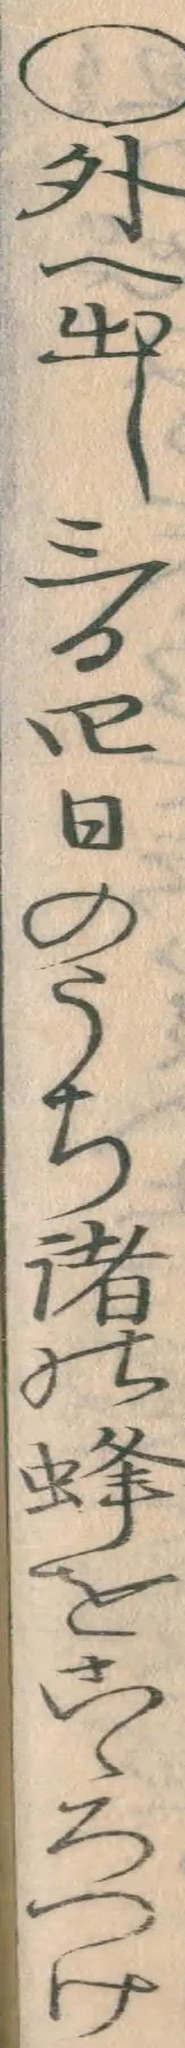○外へ出し三日四日のうち諸の蜂をこゝろつけ
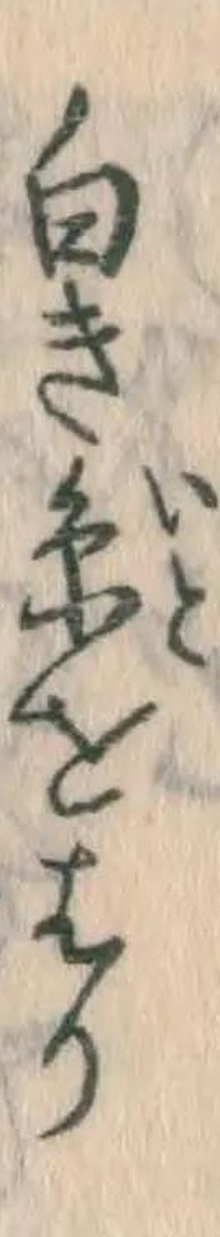白き糸をはり
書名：山繭養法秘傳抄
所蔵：国立国会図書館 National Diet Library, JAPAN
